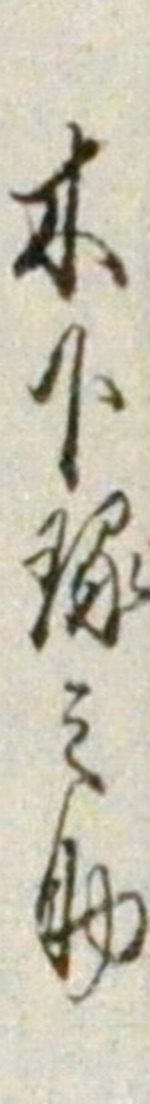木下琢之助
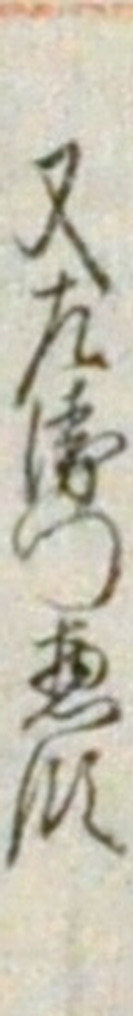一左衛門惣領
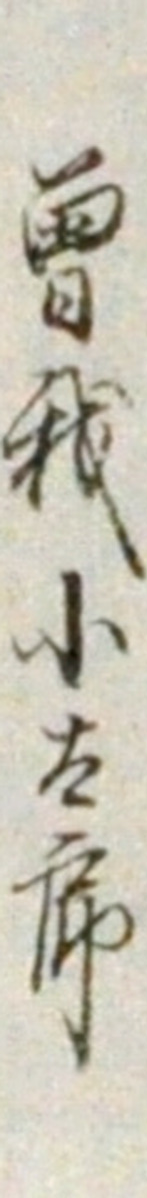曽我小太郎
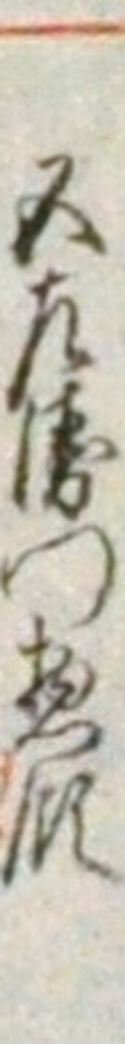一左衛門惣領
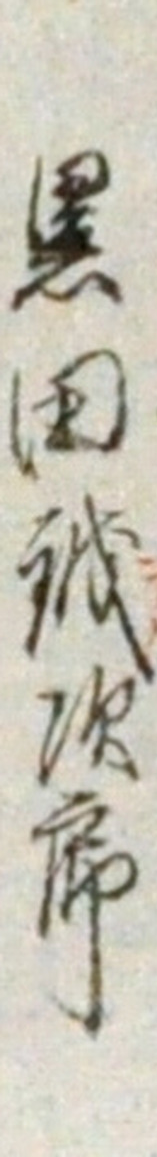黒田鋮次郎
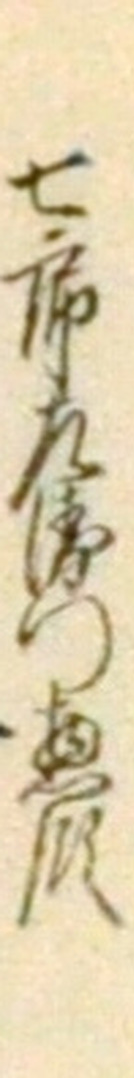七郎左衛門惣領
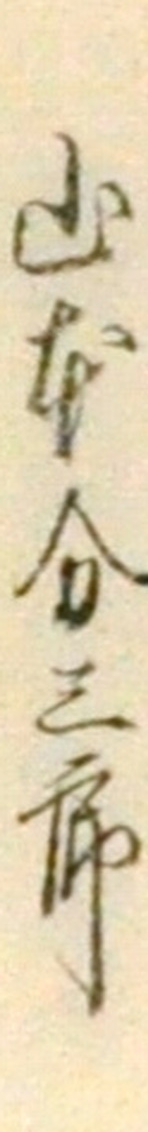山本分三郎

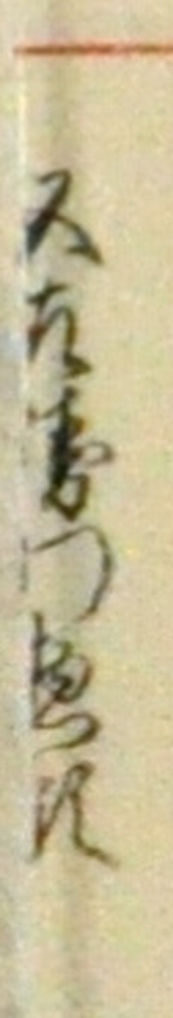又左衛門惣領
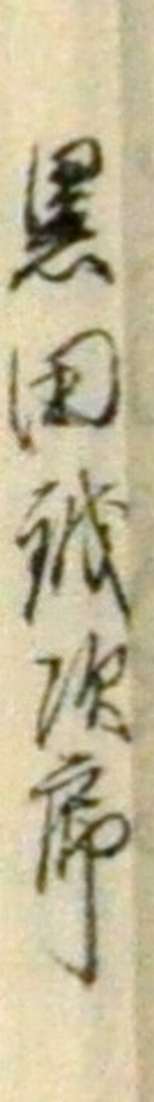黒田鋮次郎
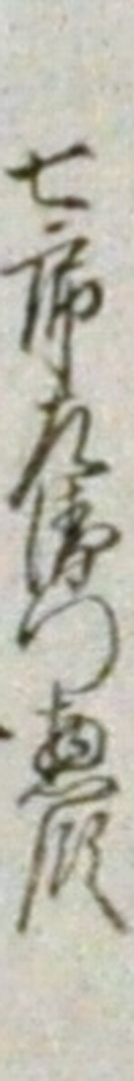七郎左衛門惣領
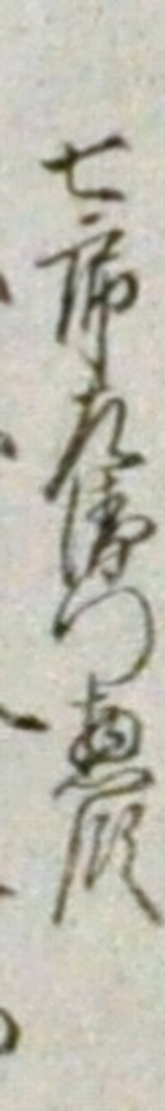七郎左衛門惣領
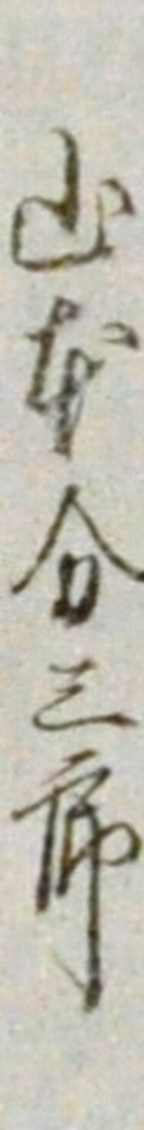山本分三郎
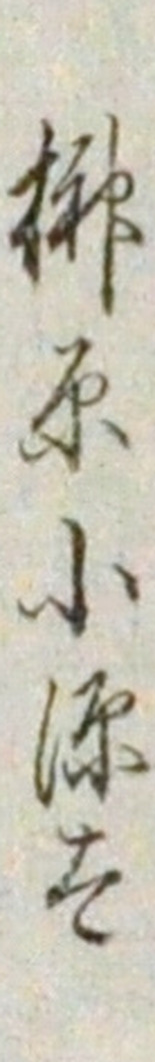榊原小源太
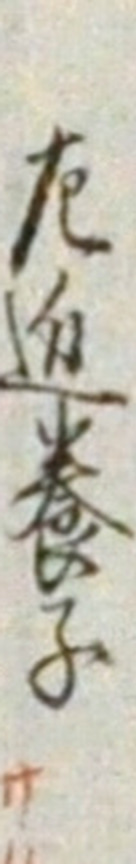左近養子
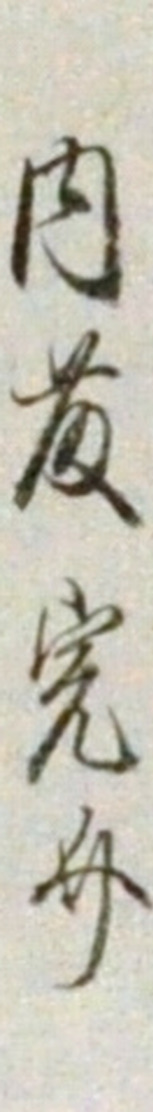内藤完介
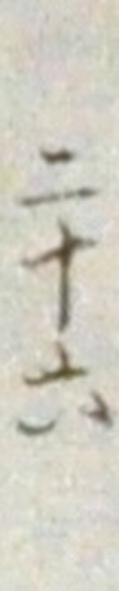二十六
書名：若年寄御役中之御書物〔一括〕
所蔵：伊那市立高遠町図書館・合同会社AMANE
